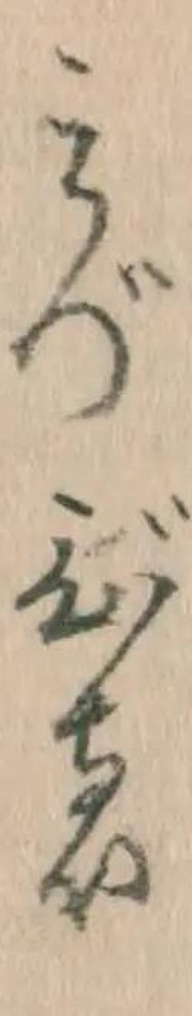みづびゑ
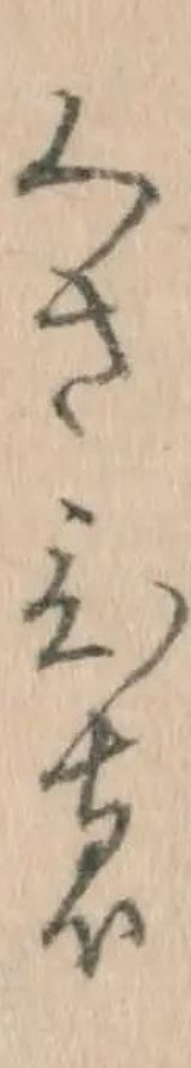くさひゑ
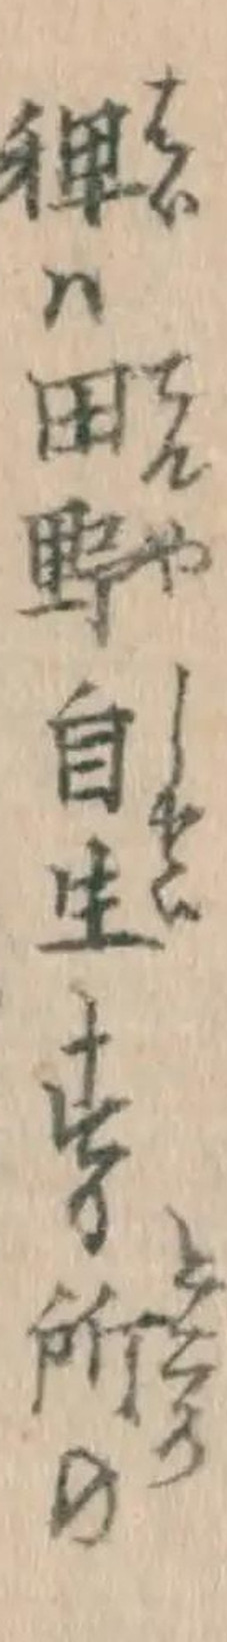稗は田野自生する所の
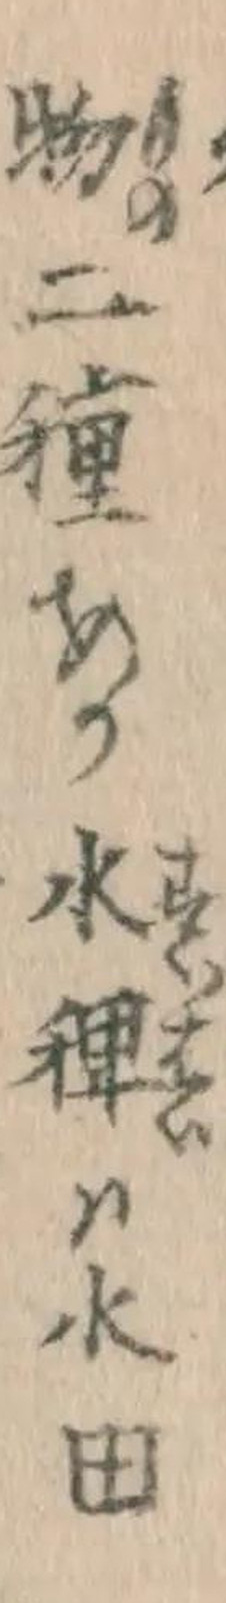物二種あり水稗は水田
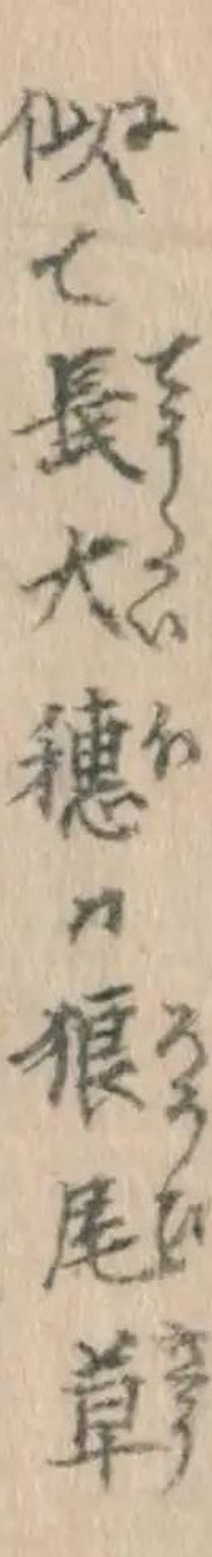似て長大穂は狼尾草

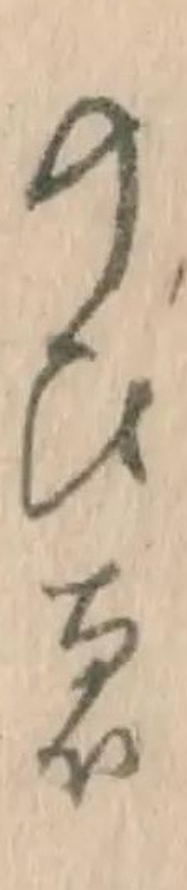のひゑ
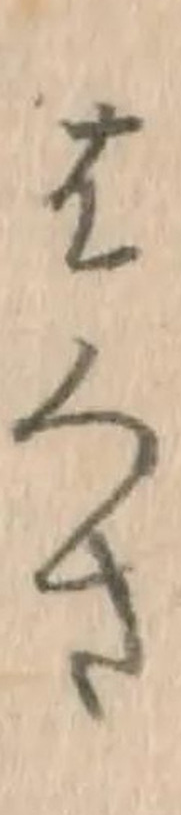はくさ
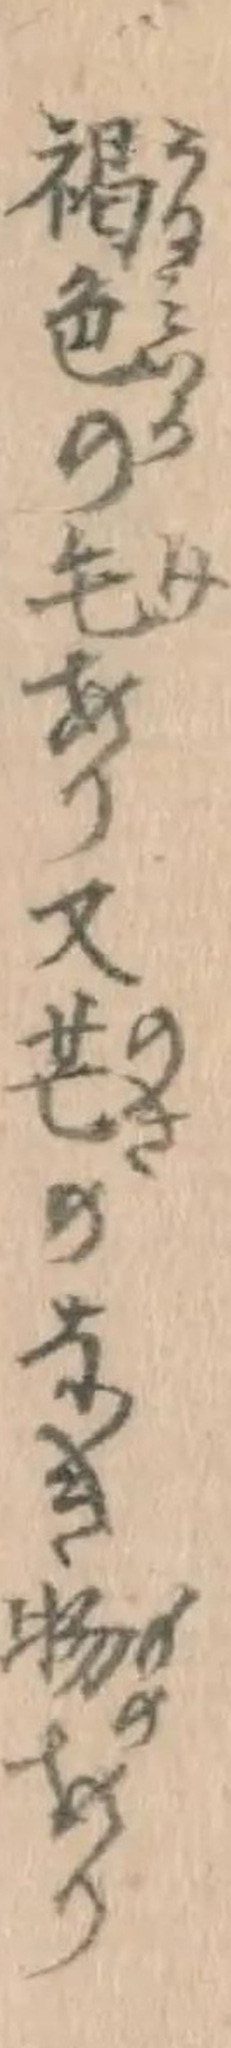褐色の毛あり又芒のなき物あり
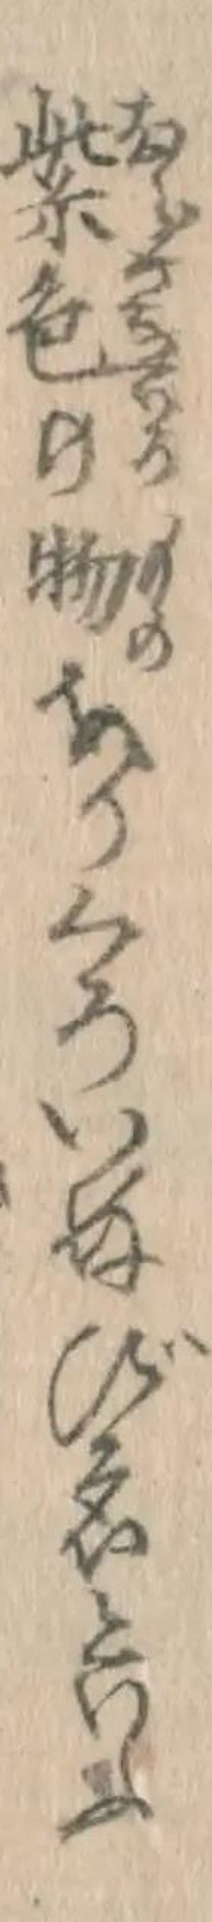紫色の物ありくろいぬびゑといふ
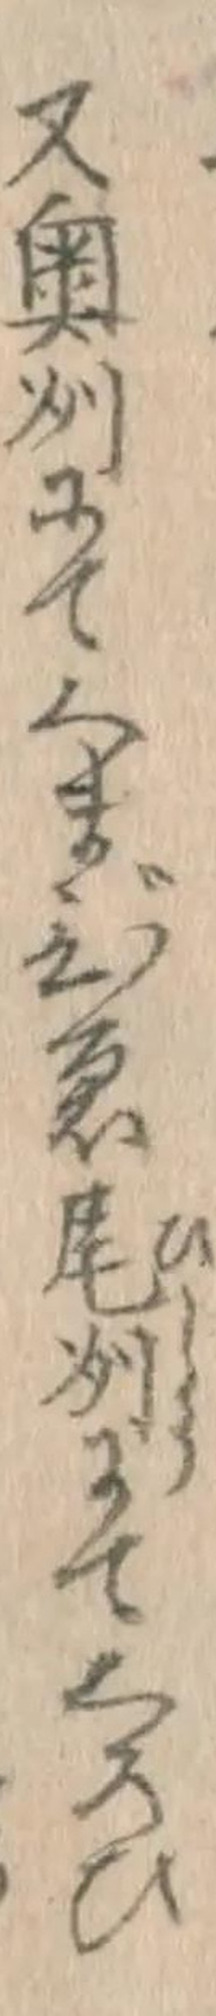又奥州にてくまびゑ尾州にてくろひ
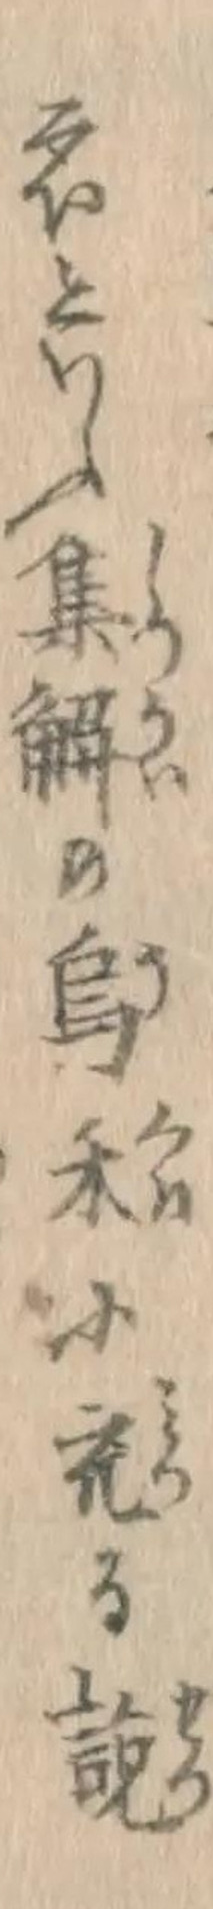ゑといふ集解の烏禾に充る説
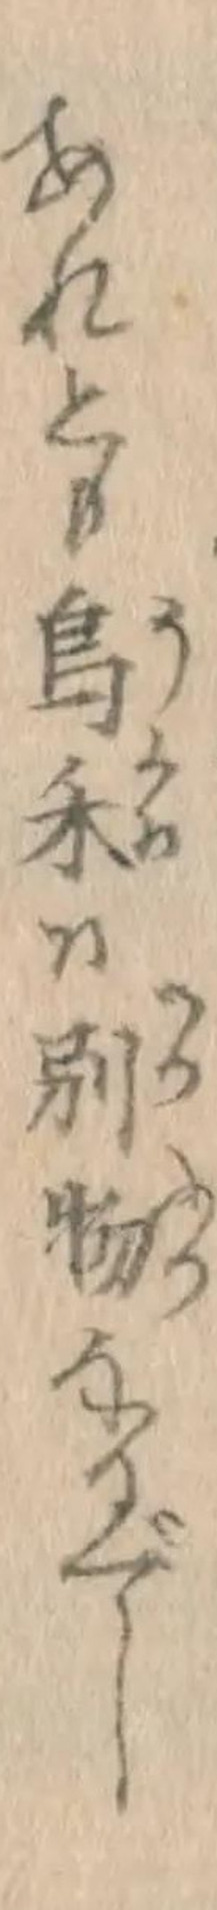あれとも烏禾は別物なるべし

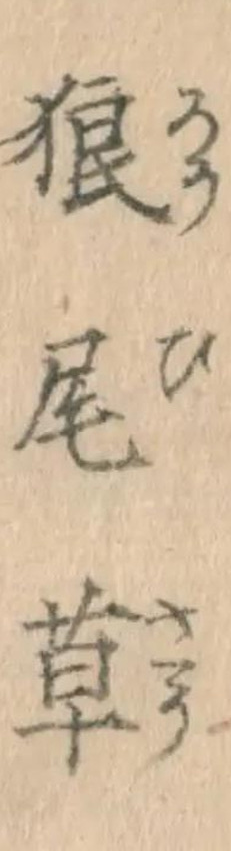狼尾草
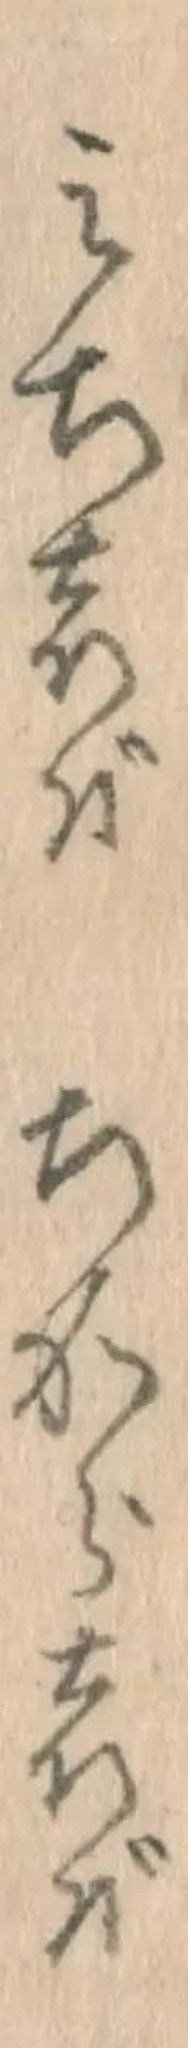みちしばちからしば
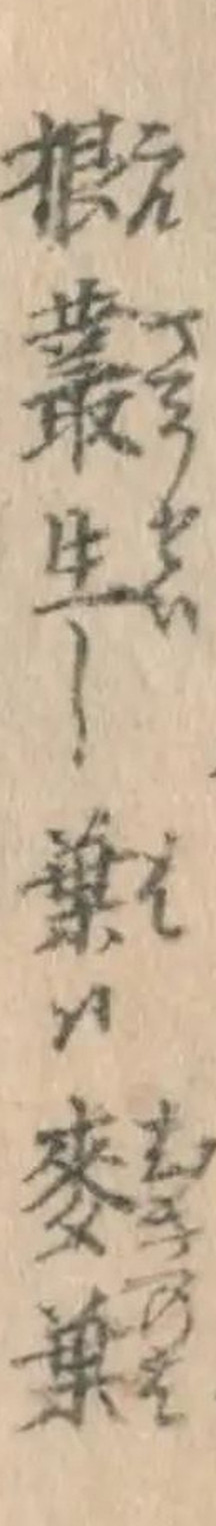根叢生し葉は麦葉
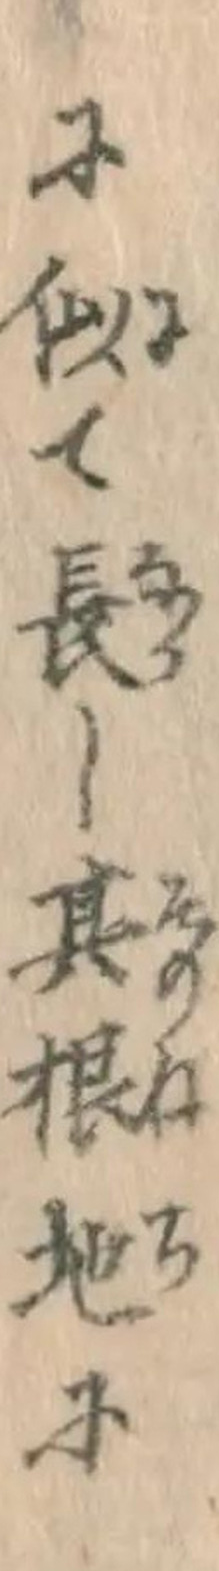に似て長し其根地に
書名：本草図譜. 巻40-42
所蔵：国立国会図書館 National Diet Library, JAPAN
